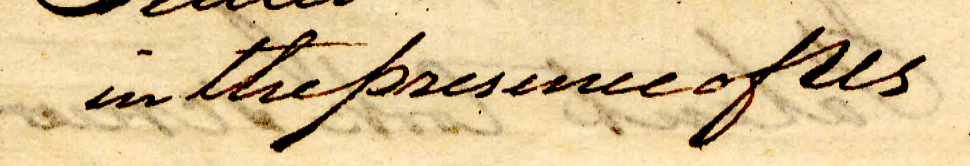in the presence of us
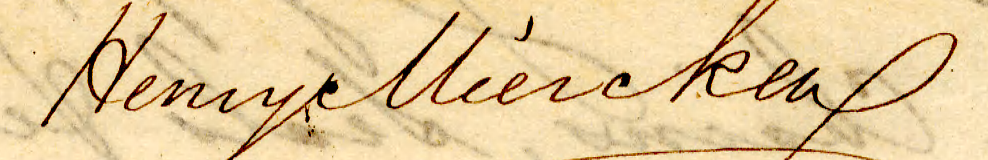Henry Miercken
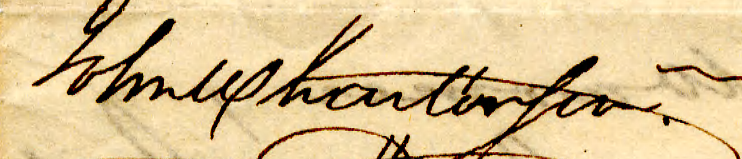John Kartinsen
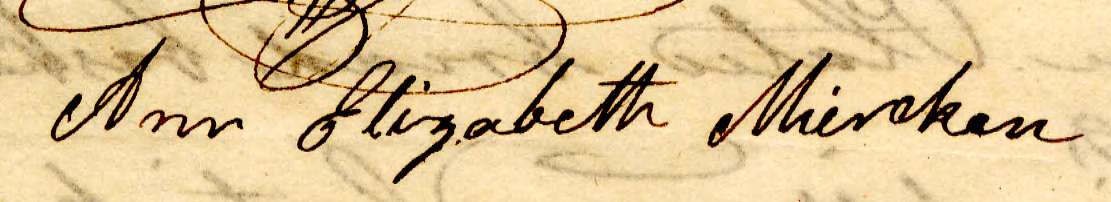Ann Elizabeth Miercken
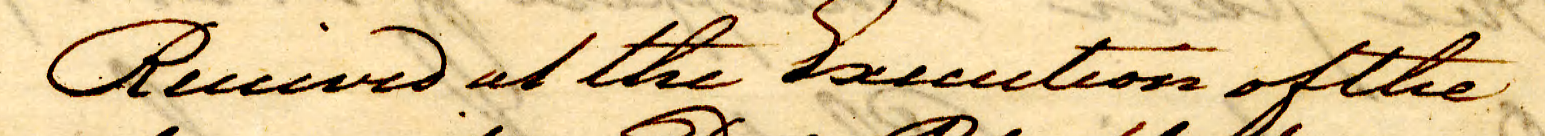Received at the Execution of the
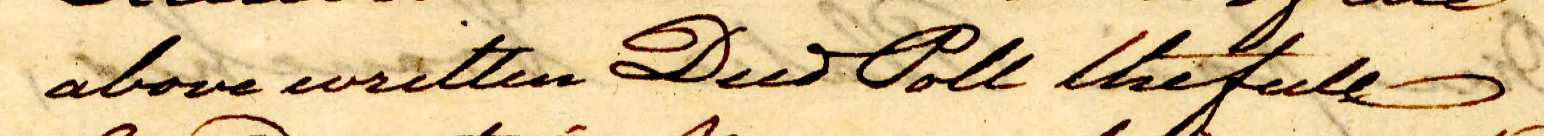above written Deed Poll the full
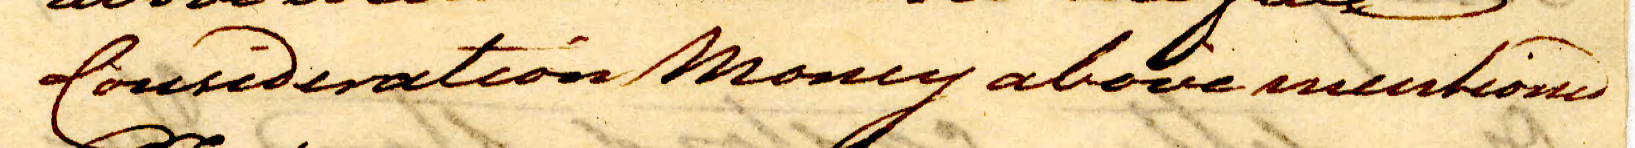Consideration Money above mentioned
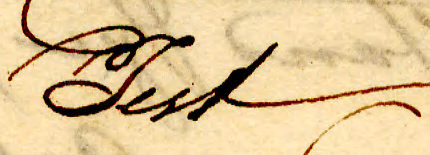Text
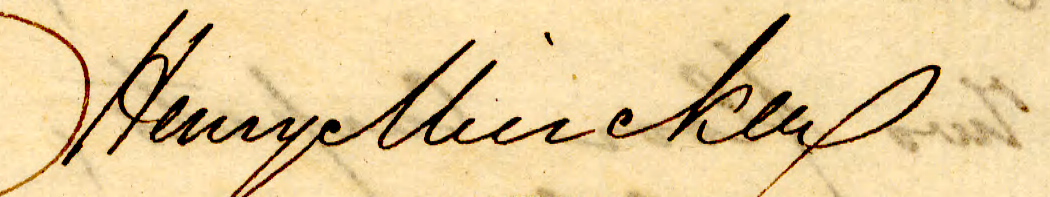Henry Miercken
